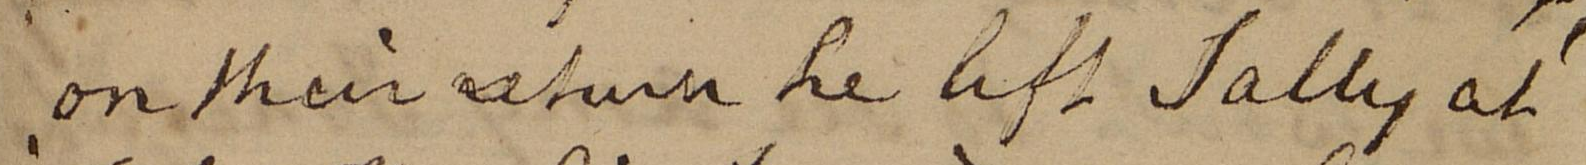on their return he left Sally at
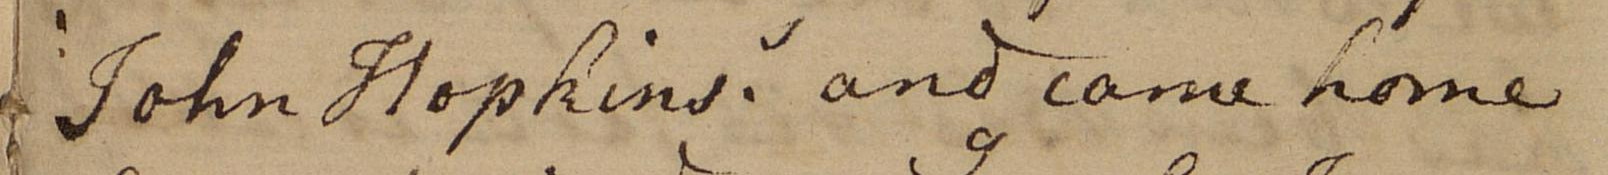John Hopkins^s. and came home
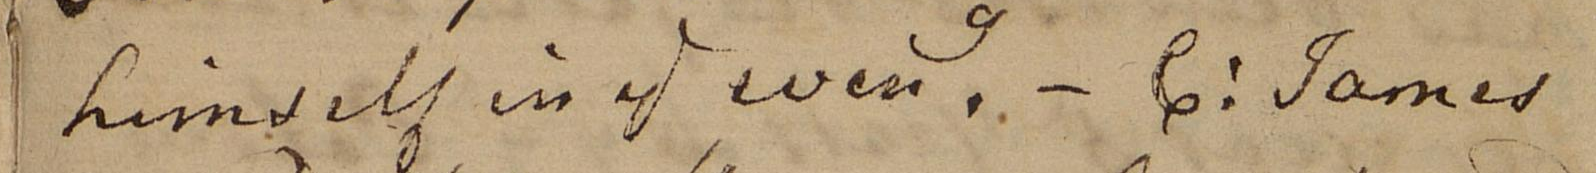himself in y^e even^g. - C: James
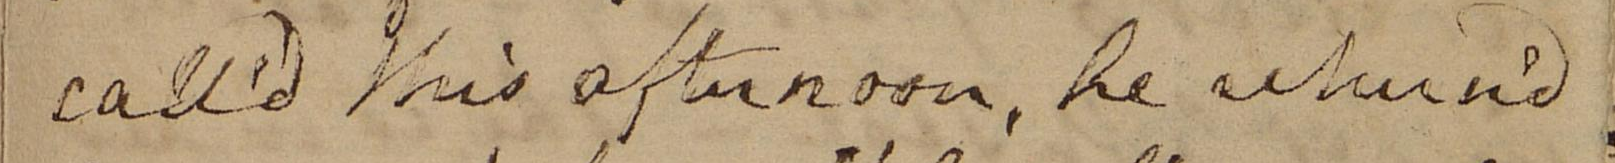call'd this afternoon, he return'd
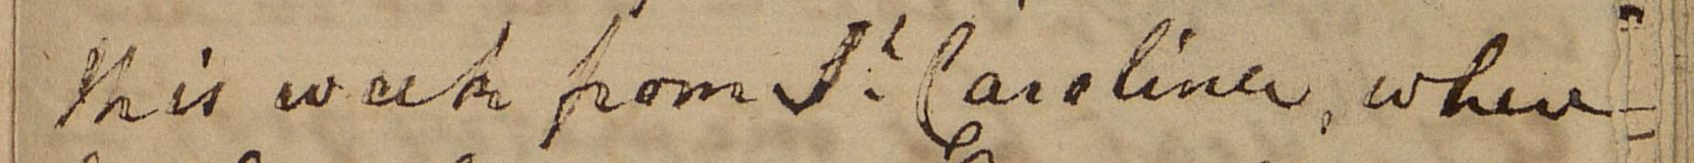this week from S^h. Carolina, where
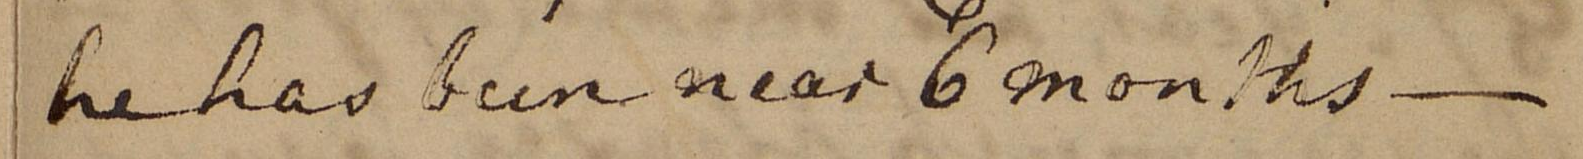he has been near 6 months-
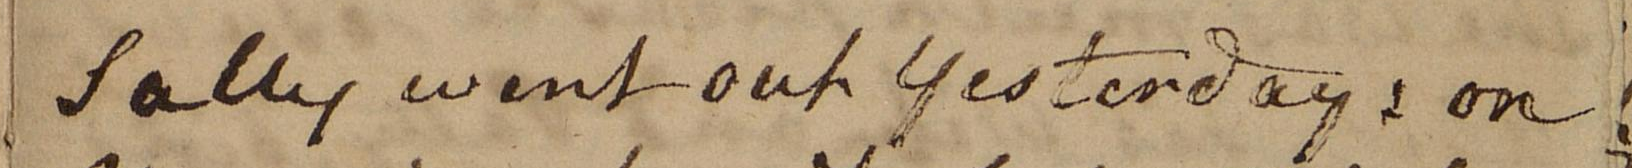Sally went out Yesterday : on
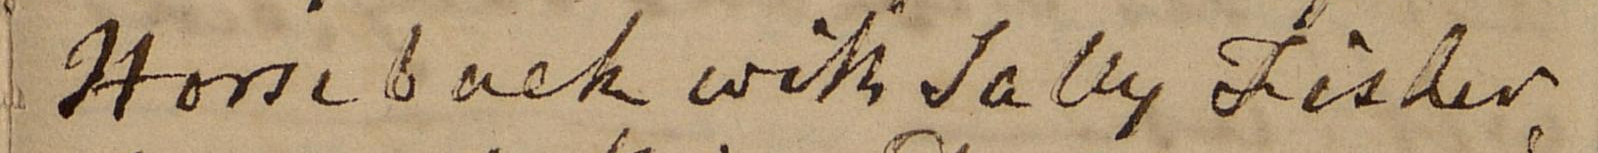Horse back with Sally Fisher,
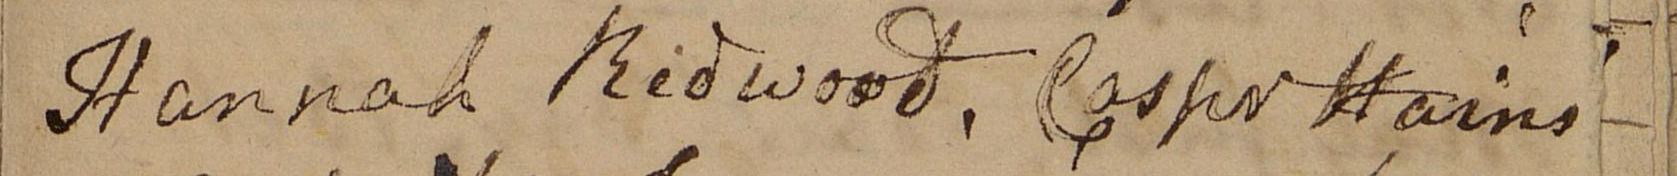Hannah Redwood, Caspr Hains-
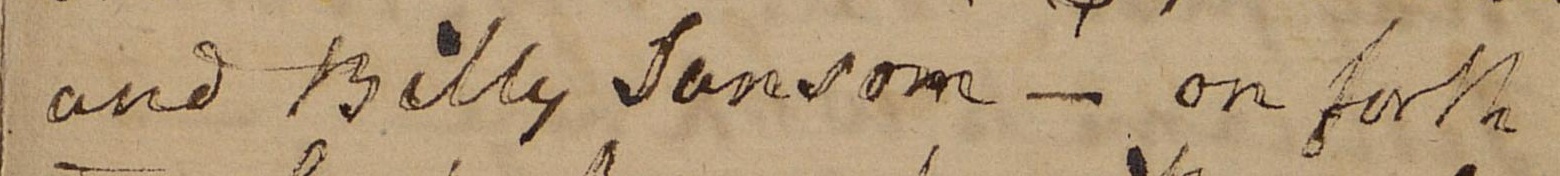and Billy Sansom- on forth
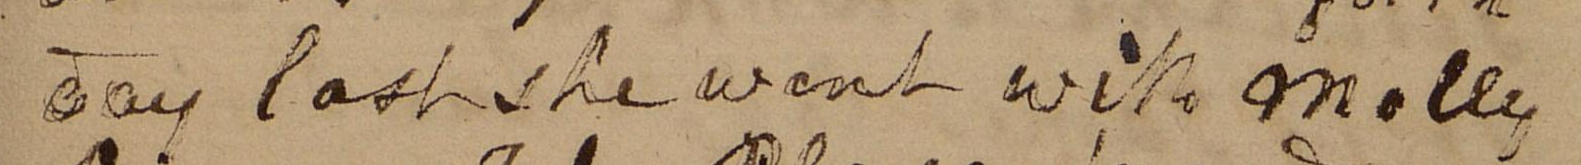day last she went with Molly
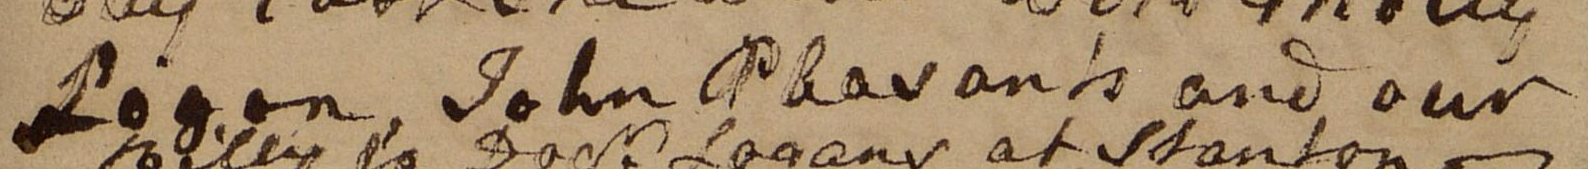Logan John Pleasants and our
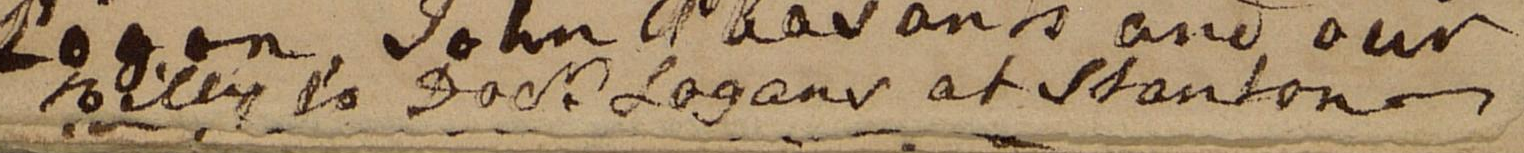Billy to Doc^r. Logans at Stanton-
